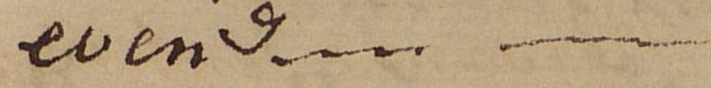even^g---
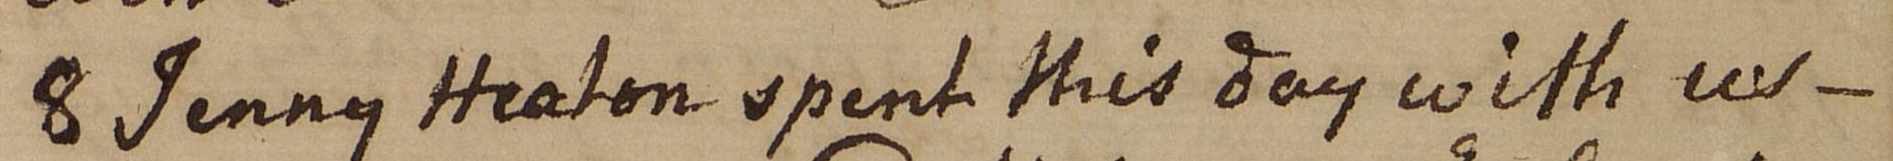8 Jenny Heaton spent this day with us-
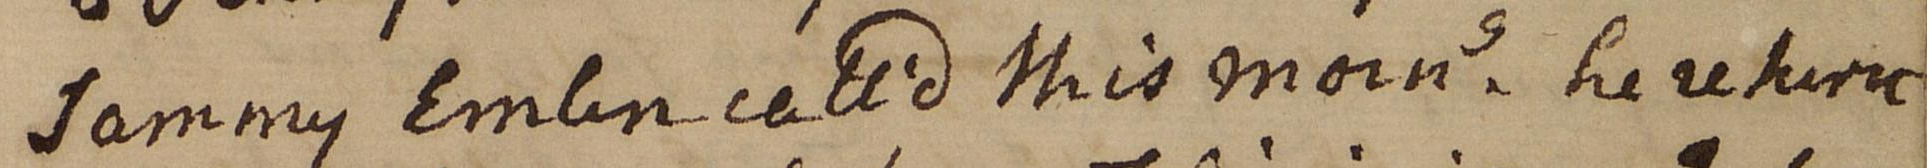Sammy Emlen call'd this morn^g- he return
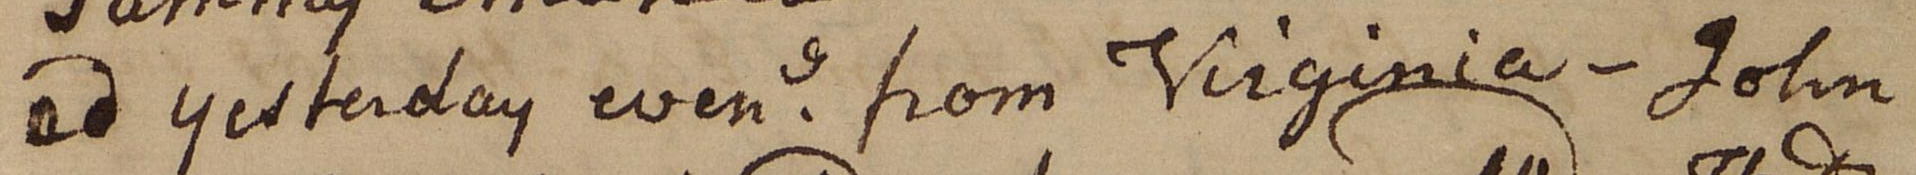nd yesterday even^g. from Virginia - John
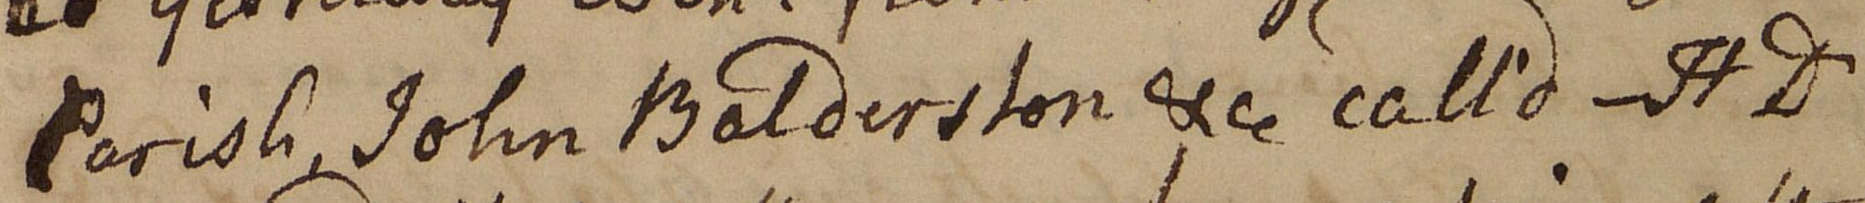Parish, John Balderston &c call'd- HD
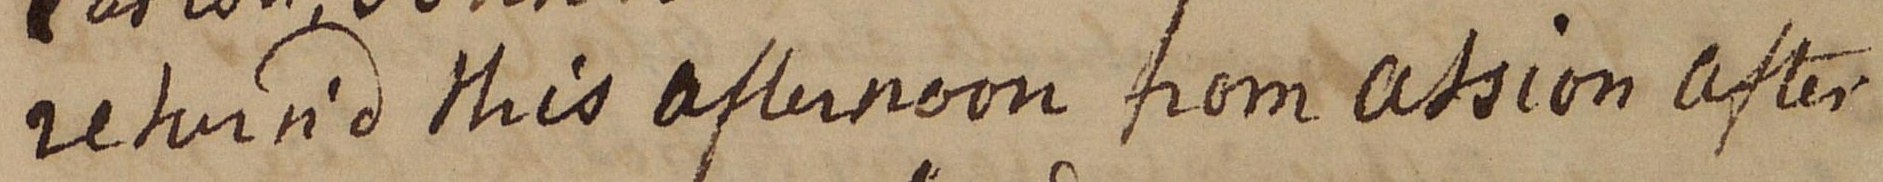return'd this afternoon from Atsion After
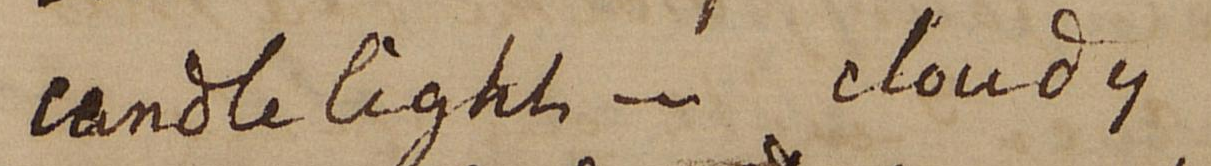candle light- cloudy
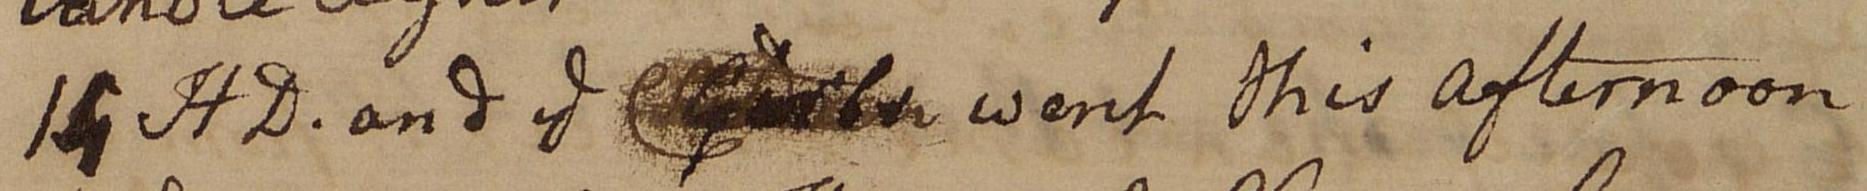15 HD. and y^e [_____] went this afternoon
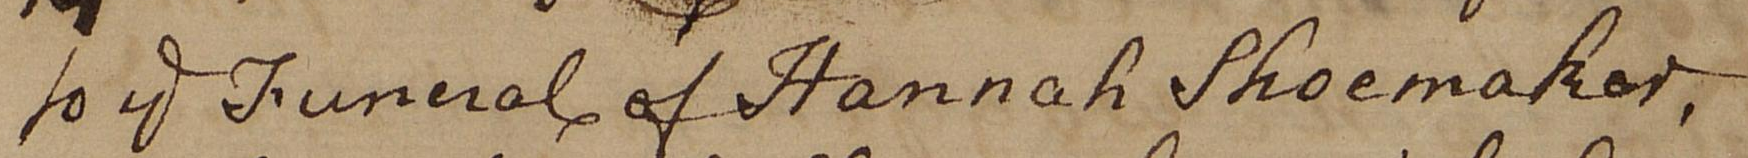to y^e Funeral of Hannah Shoemaker,
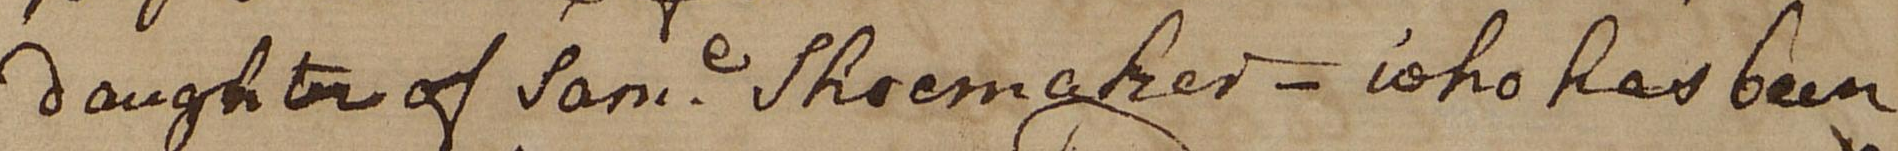daughter of Sam^l. Shoemeker- who has been
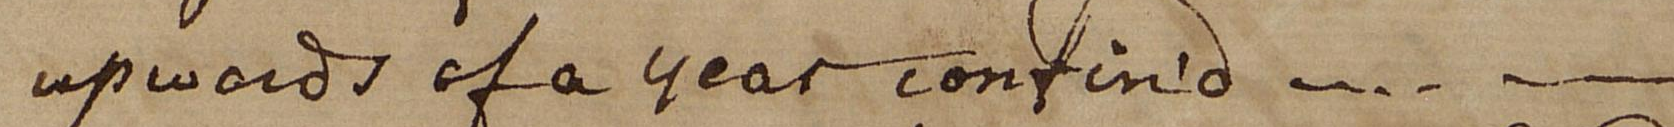upwards of a year confin'd-
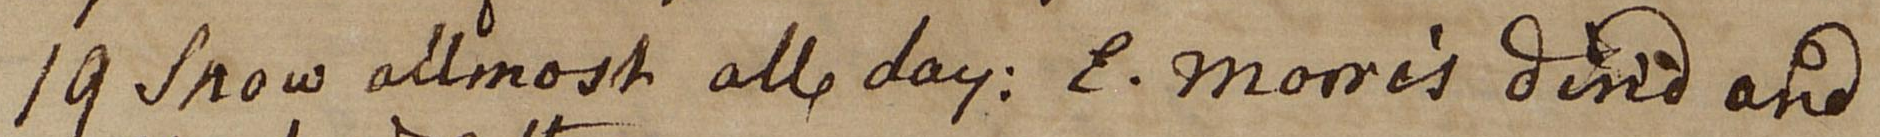19 Snow allmost all day: E. Morris din'd and
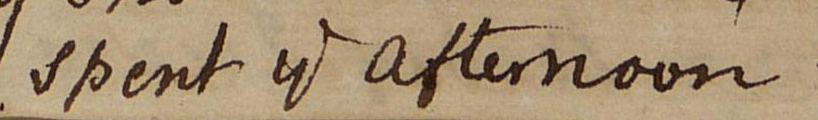spent y^e afternoon -
